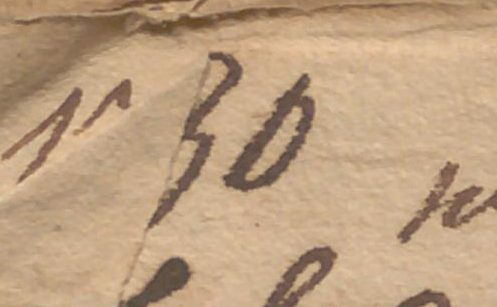80
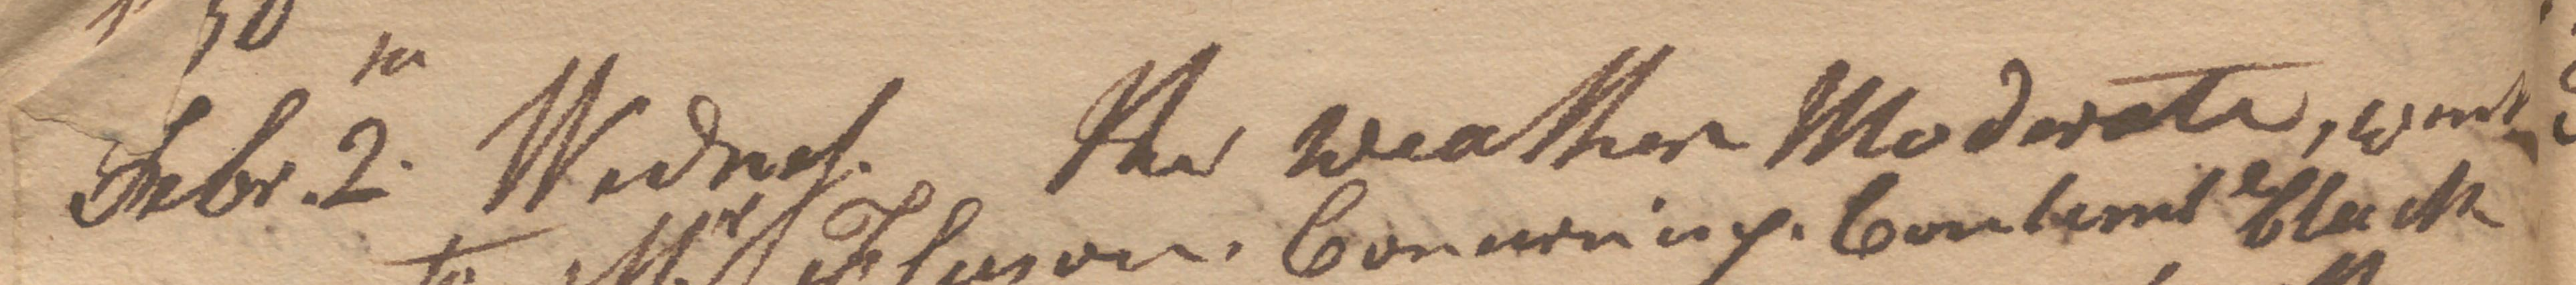Febr 2^th Wednes. the weather Moderate, went
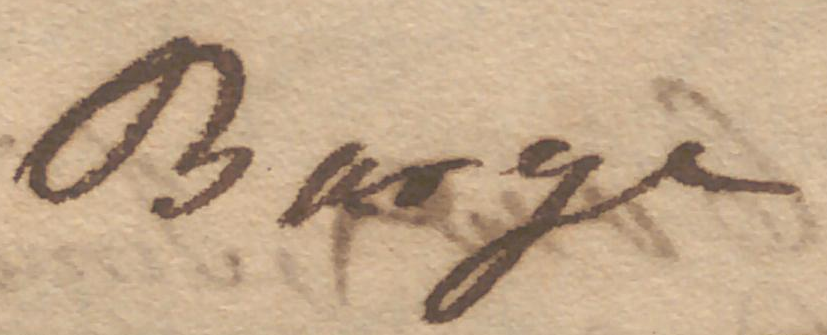Barge
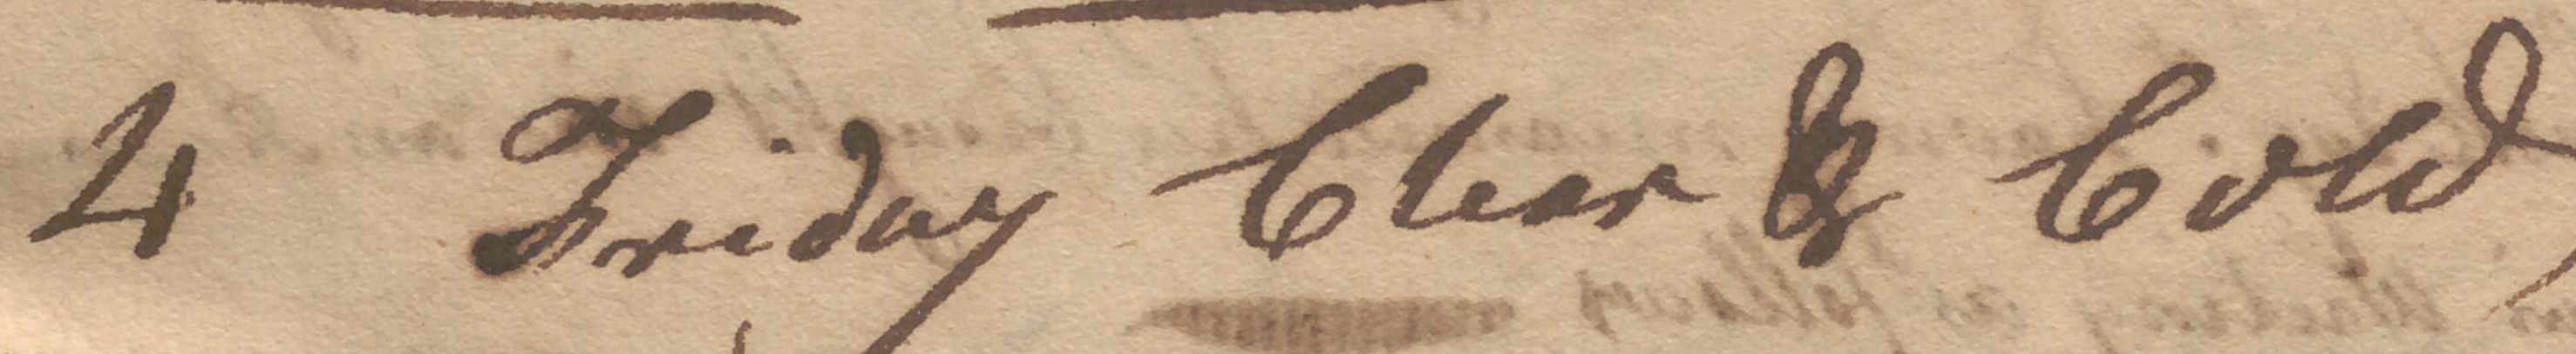4 Friday Clear & Cold
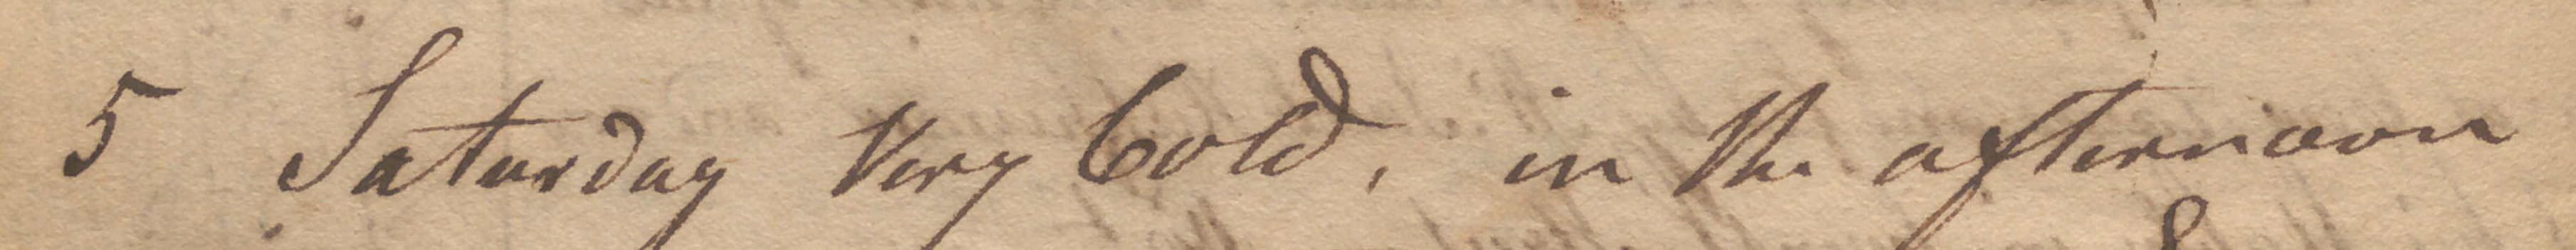5 Saturday Very Cold, in the afternoon
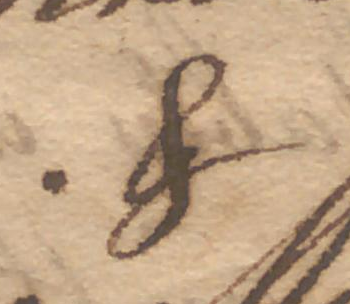&
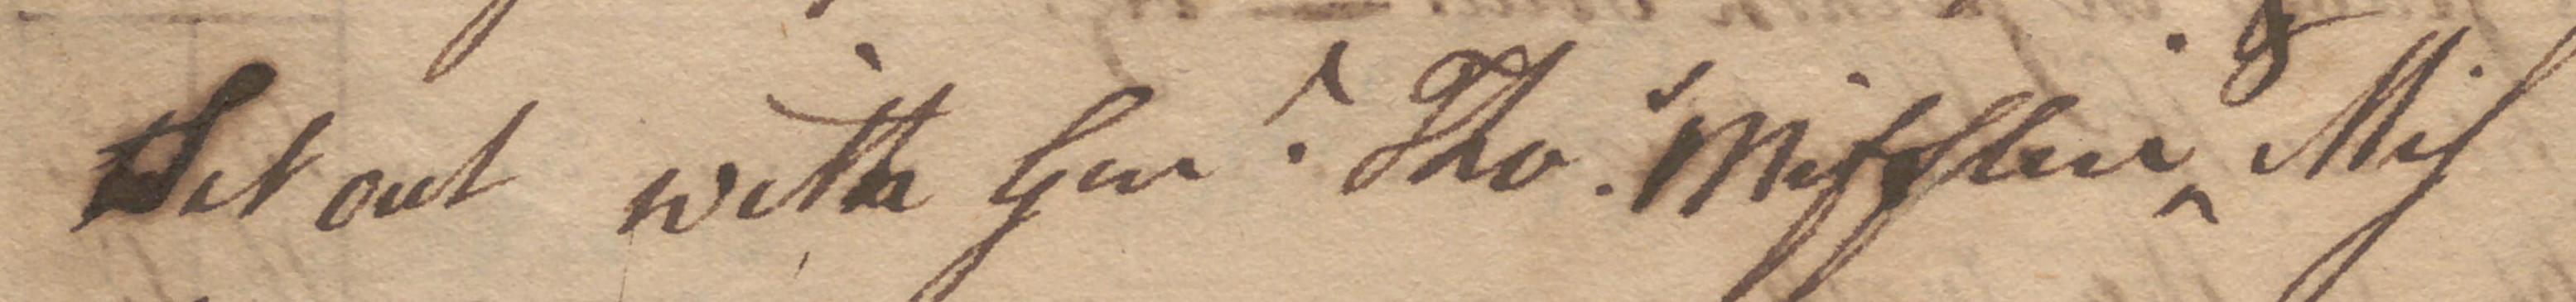Set out with Gen^l. Tho^s. Mifflin ^ Mis
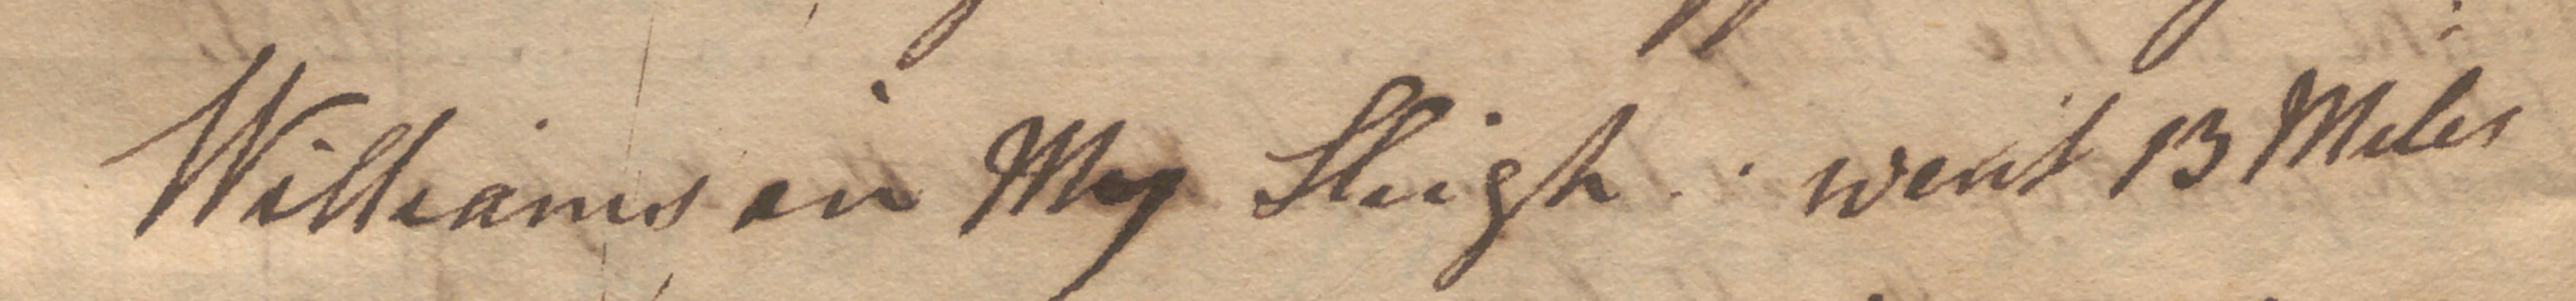Williams an My Sleigh; went 13 Miles
